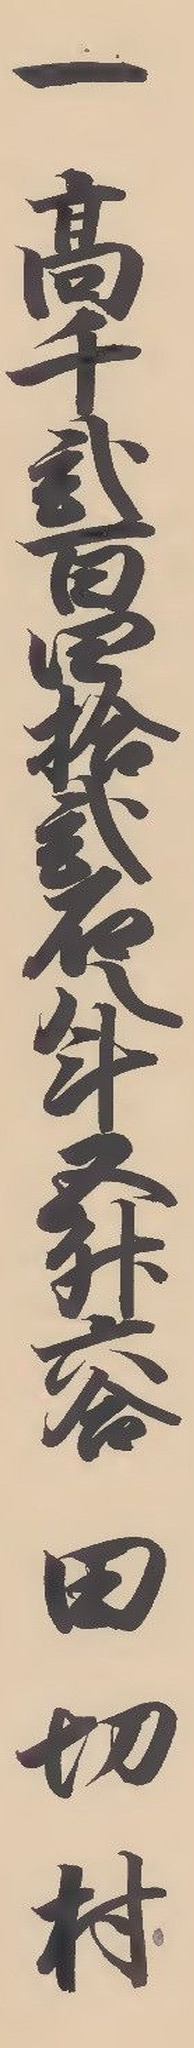一高千弐百四拾弐石八斗五升六合田切村

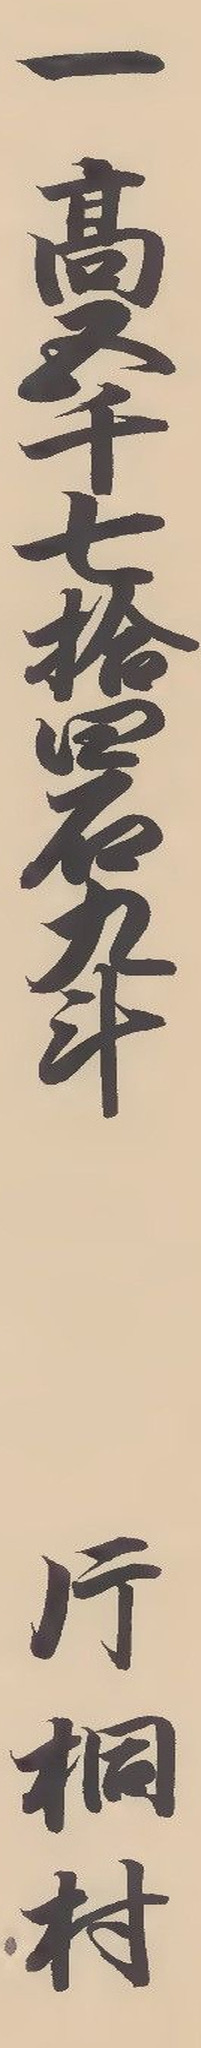一高五千七拾四石九斗片桐村
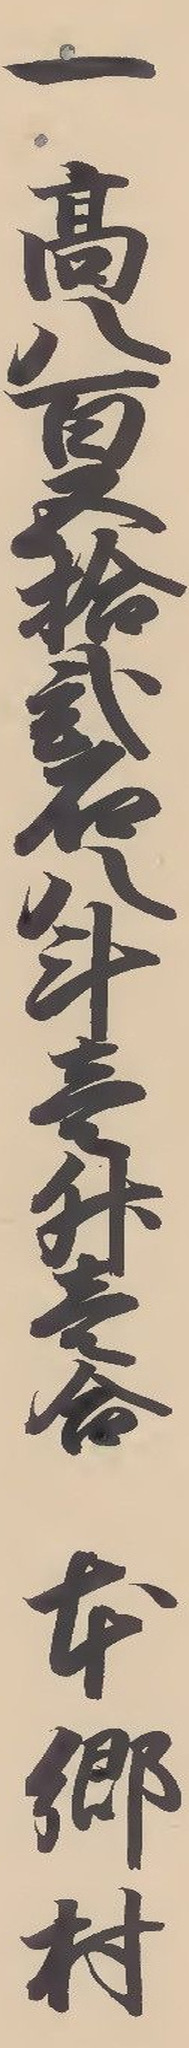一高八百五拾弐石八斗壱升壱合本郷村
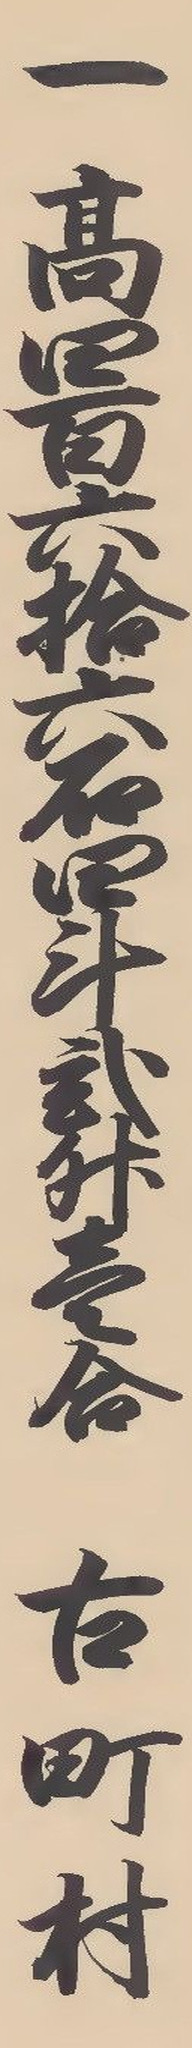一高四百六拾六石四斗弐升壱合古町村
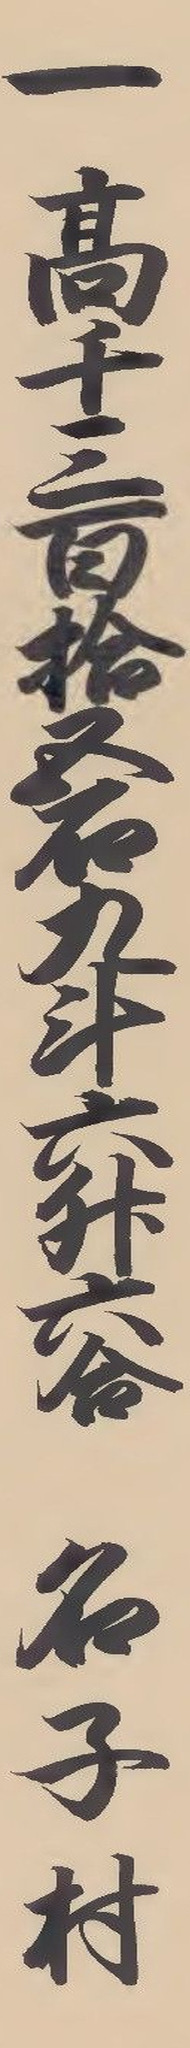一高千三百拾五石九斗六升六合名子村
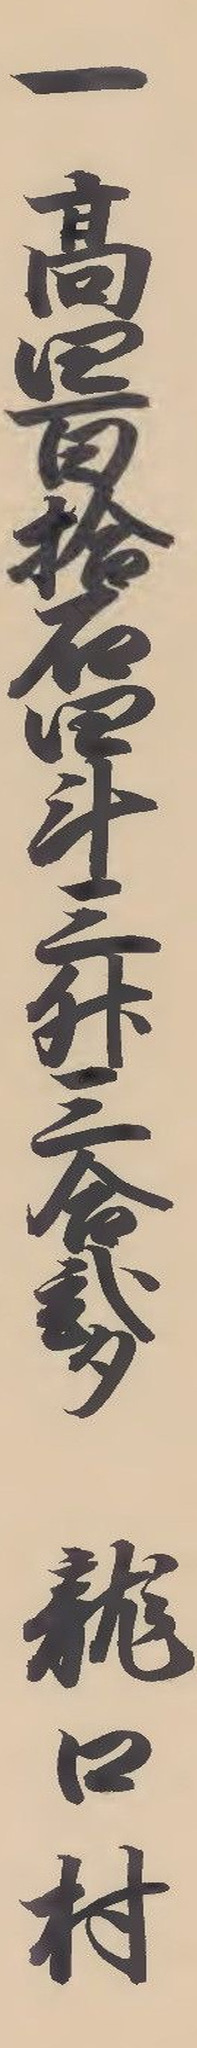一高四百拾石四斗三升三合弐勺竜口村
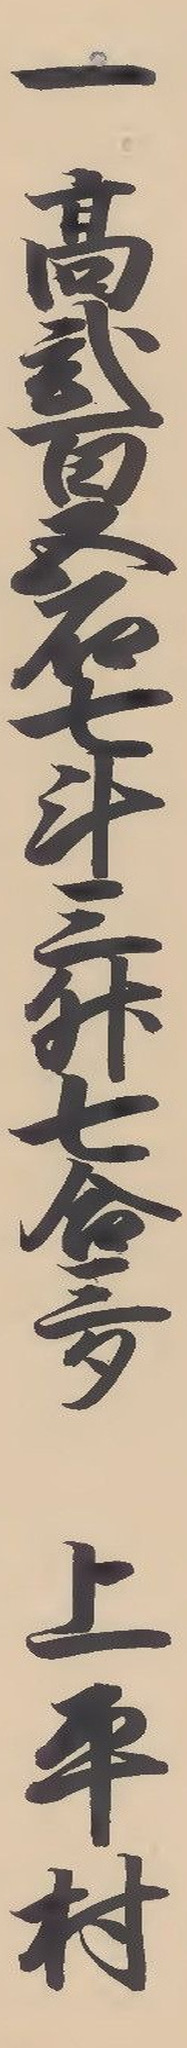一高弐百五石七斗三升七合三勺上平村

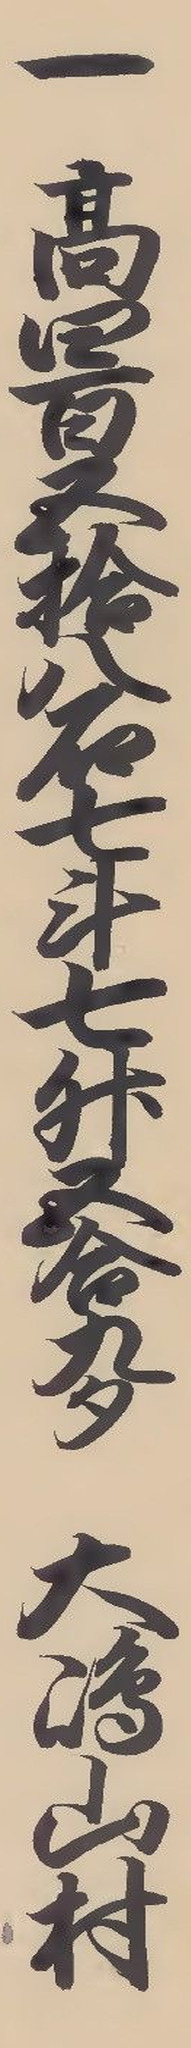一高四百五拾八石七斗七升五合九勺大島山村
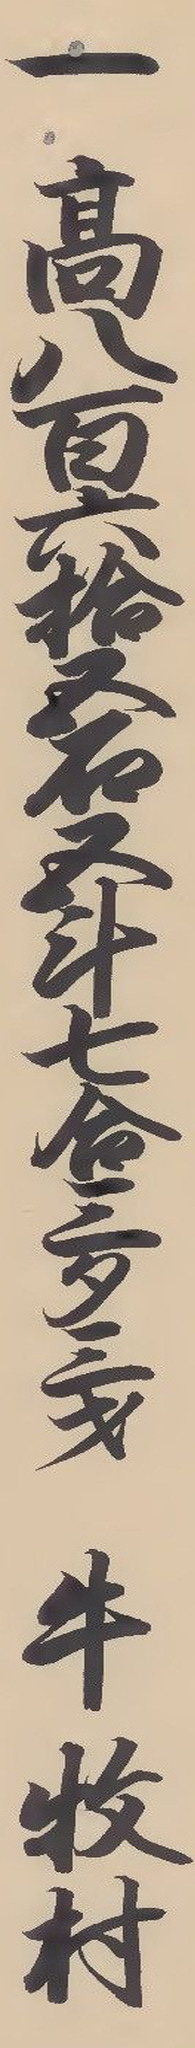一高八百六拾五石五斗七合三勺三才牛牧村
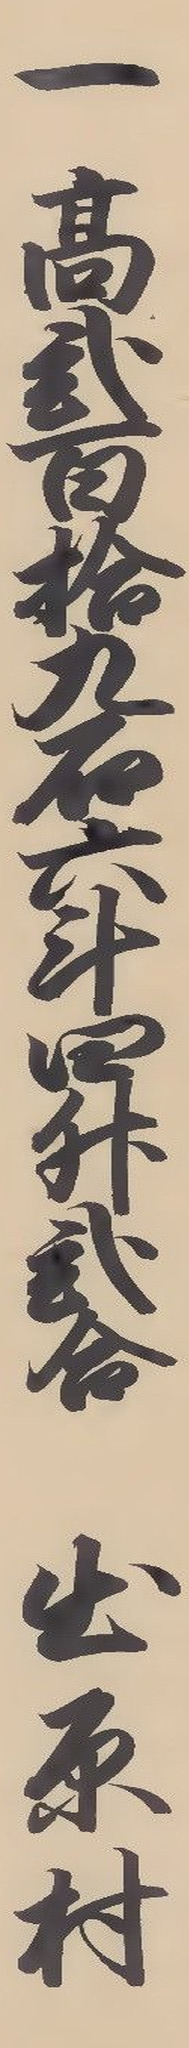一高弐百拾九石六斗四升弐合出原村
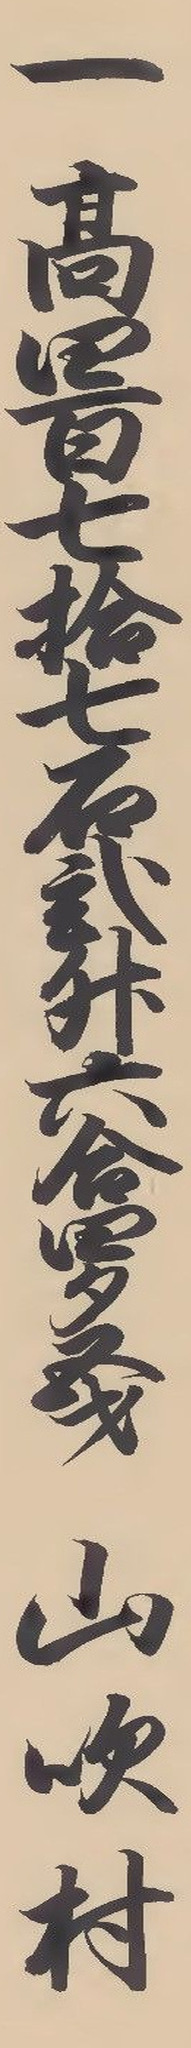一高四百七拾七石弐升六合四勺五才山吹村
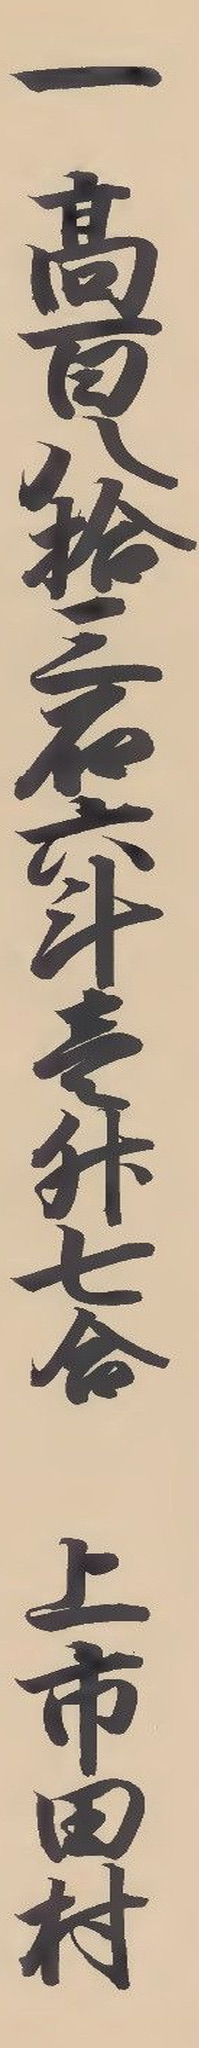一高百八拾三石六斗壱升七合上市田村
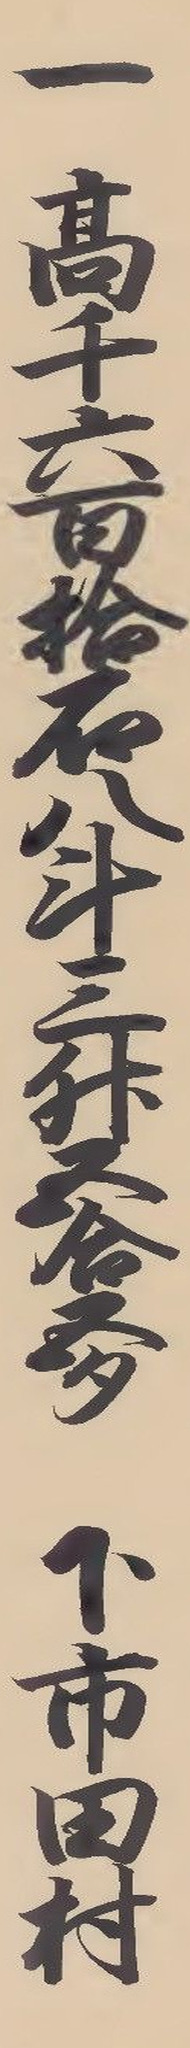一高千六百拾石八斗三升五合五勺下市田村
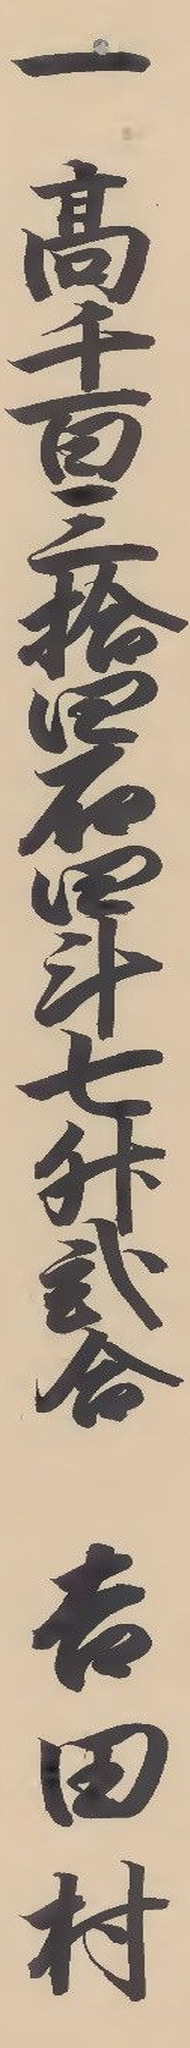一高千百三拾四石四斗七升弐合吉田村
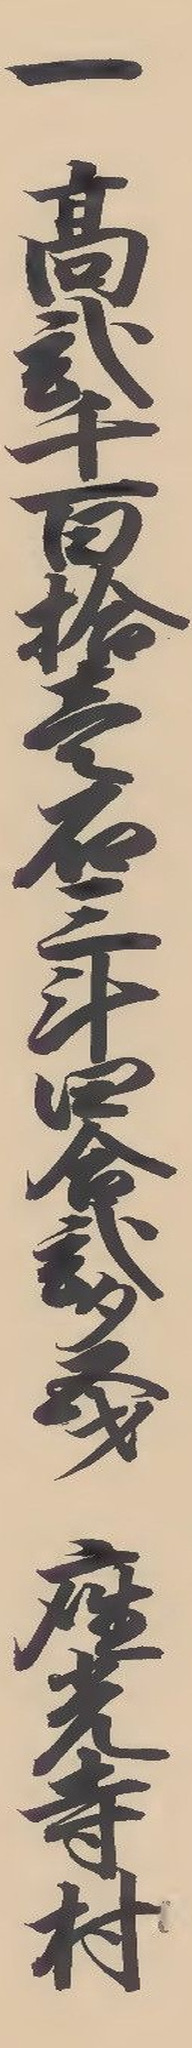一高弐千百拾壱石三斗四合弐勺五才座光寺村

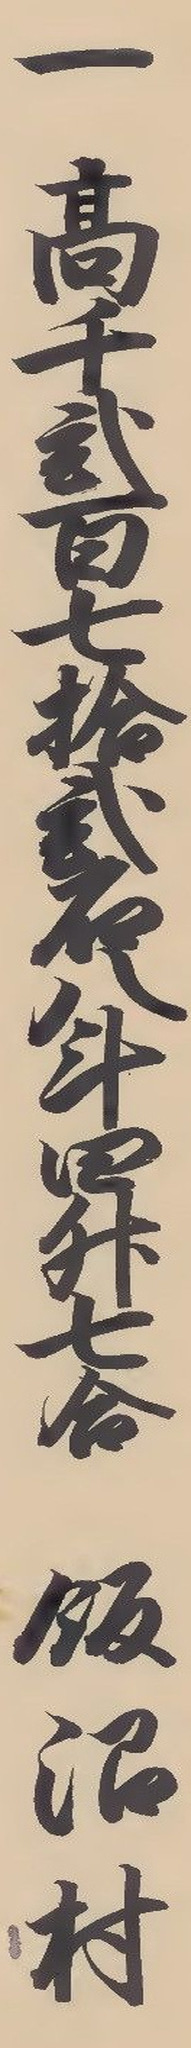一高千弐百七拾弐石八斗四升七合飯沼村
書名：信濃国郷帳
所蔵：国立公文書館 National Archives of Japan
